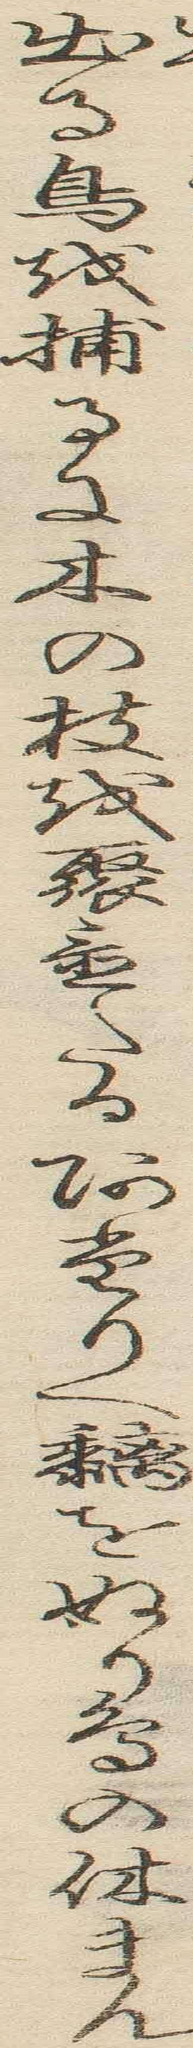出る鳥を捕るに木の枝を聚置たるあたりへ黐をぬり鳥の休まん
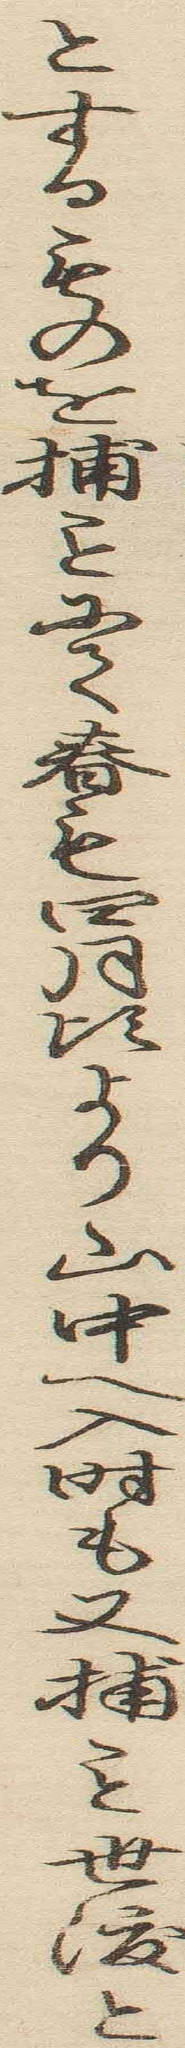とするものを捕ことにて春も四月頃より山中へ入时も又捕こと世渡と

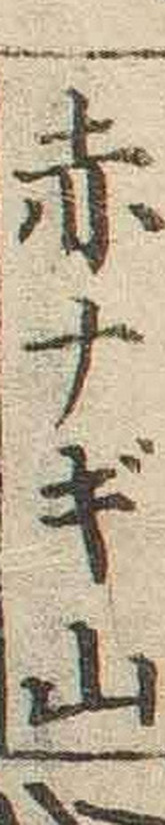赤ナギ山

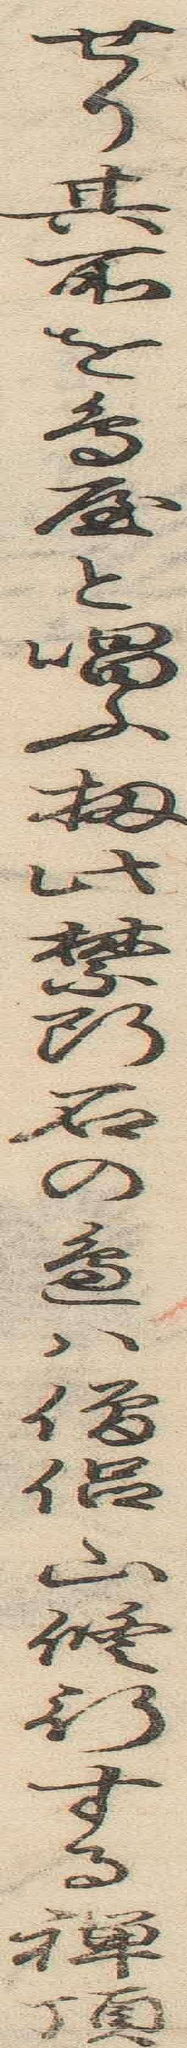せり其所を鳥屋と唱ふ扨此禁断石の邊は僧侶山修行する禅頂
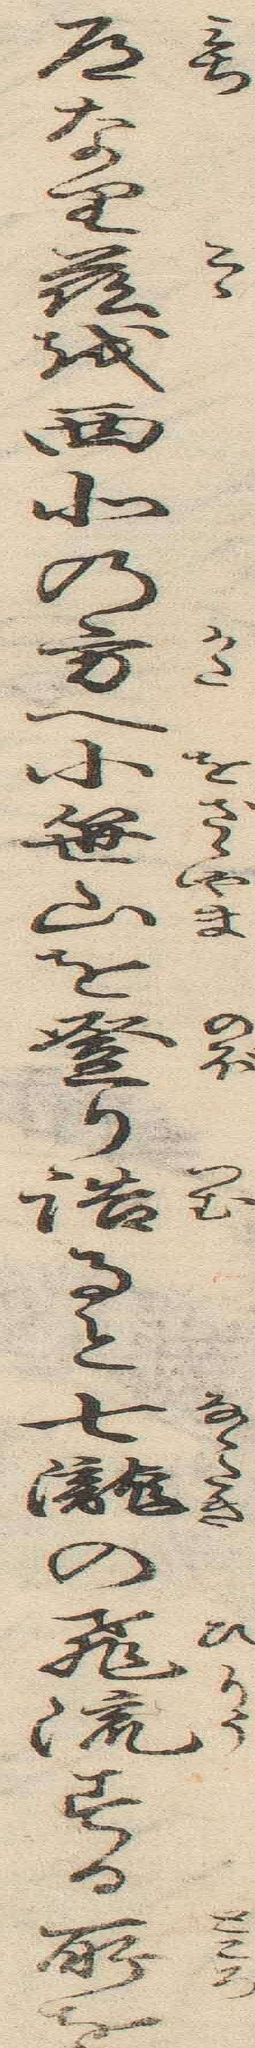道なり兹を西北の方へ小笹山を登り詰ると七瀧の飛流する所を
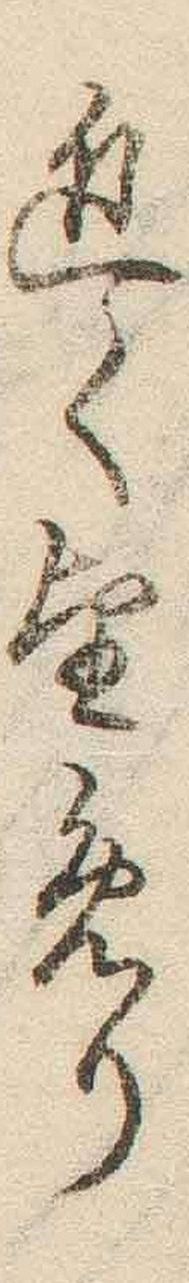近く望めり
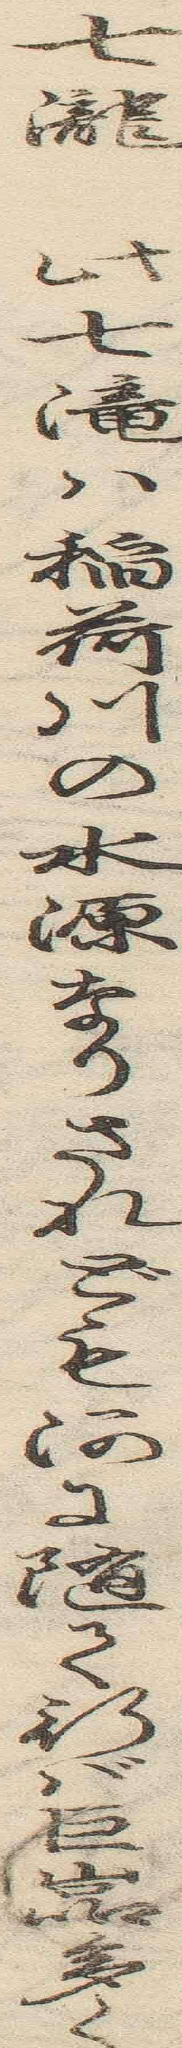七瀧此七滝は稲荷川の水源なりされども河に随て行ば巨嵓多く
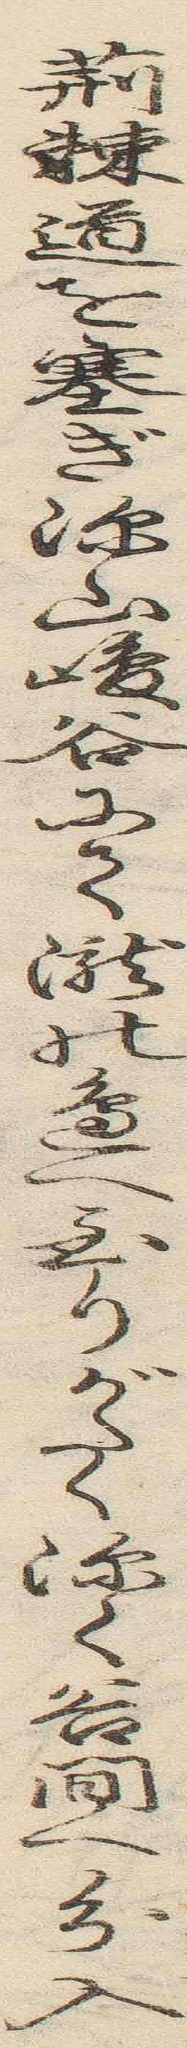荊棘道を塞ぎ深山峻谷にて瀧の邊へ至りがたく深く谷間へ分入
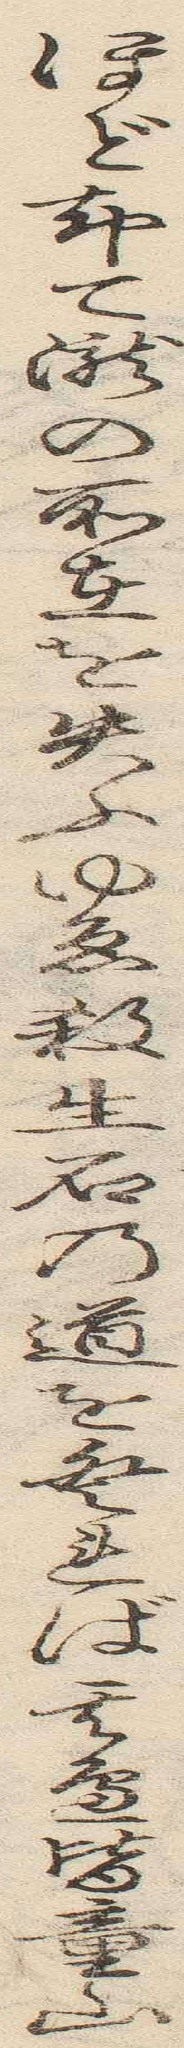ほど却て瀧の所在を失ふゆゑ殺生石の道を登れば其邊皆童山
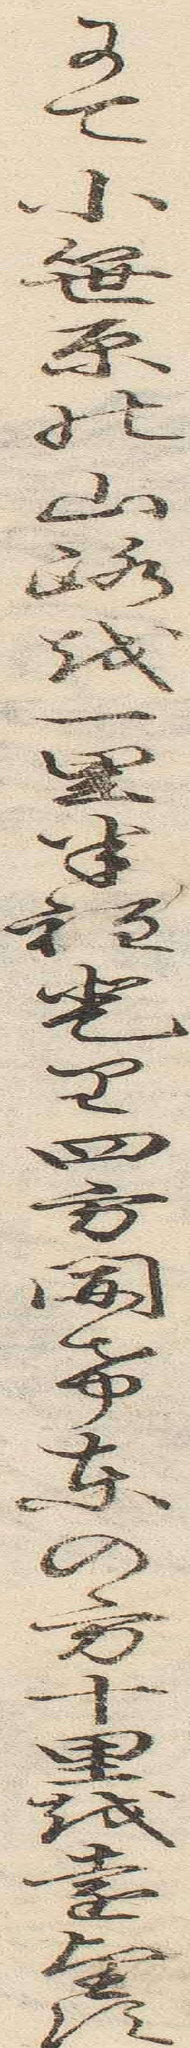にて小笹原の山路を一里半程登り四方開け東の方十里を遠望す
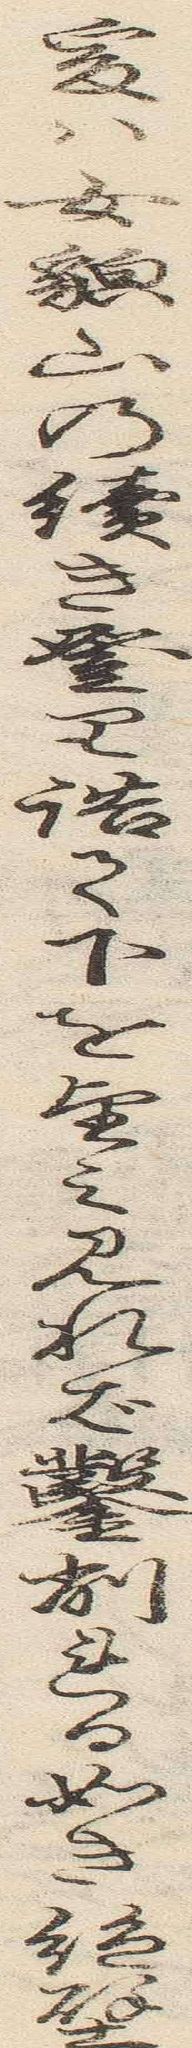爰は女貌山の續き登り詰て下を望み見れば鑿削れる如き絶壁
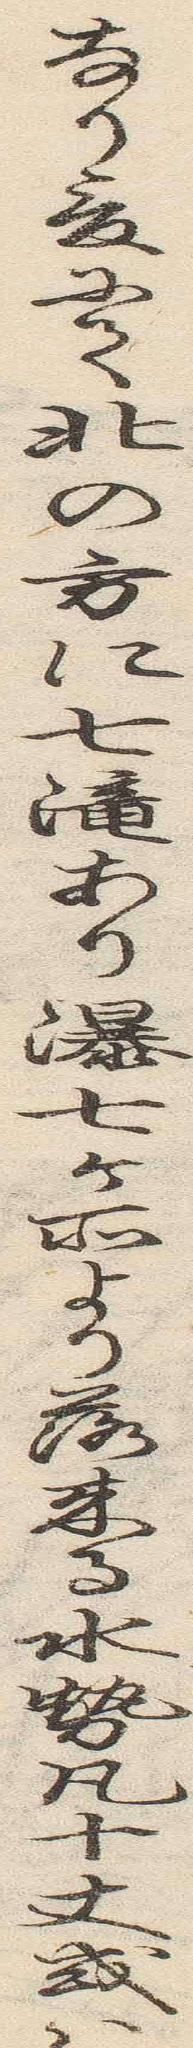なり爰にて北の方に七滝あり瀑七ヶ所より落來る水㔟凡十丈或は
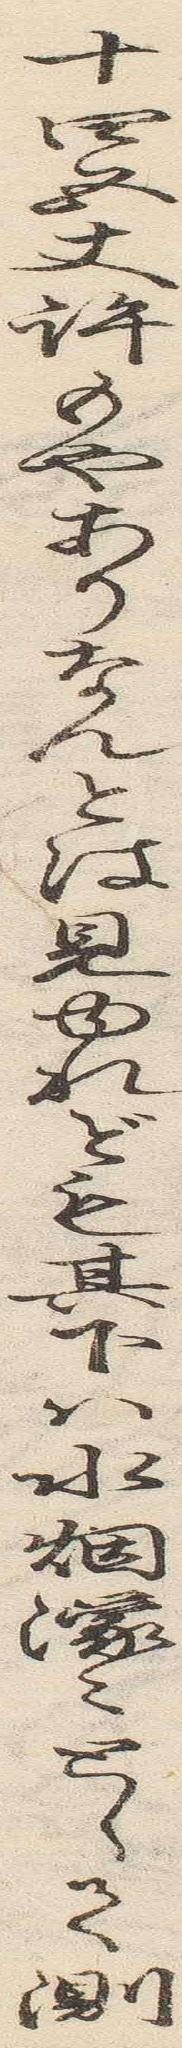十四五丈許もやありなんとは見ゆれども其下は水烟濛〻として測
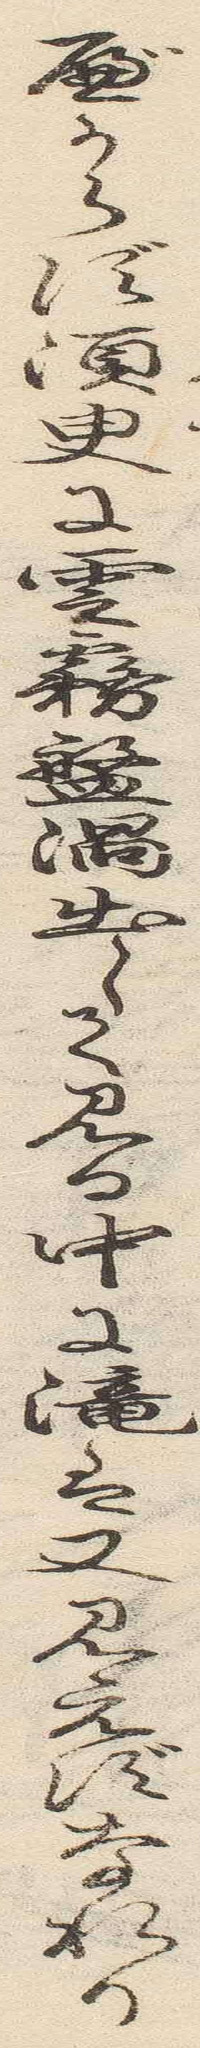べからず須臾に雲霧盤渦出して見る中に滝は又見えずなれり
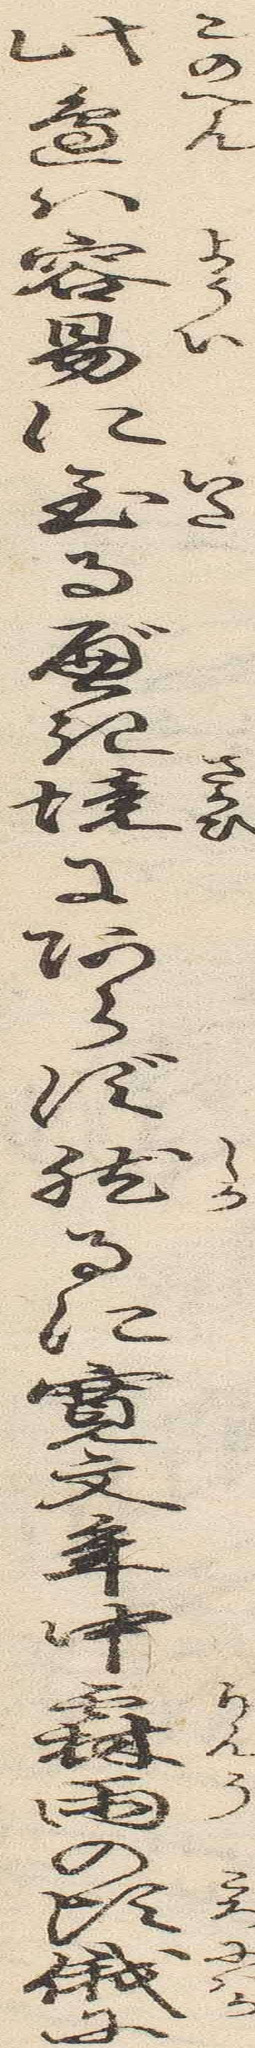此邊は容易に至るべき境にあらず然るに寛文年中霖雨の頃俄に
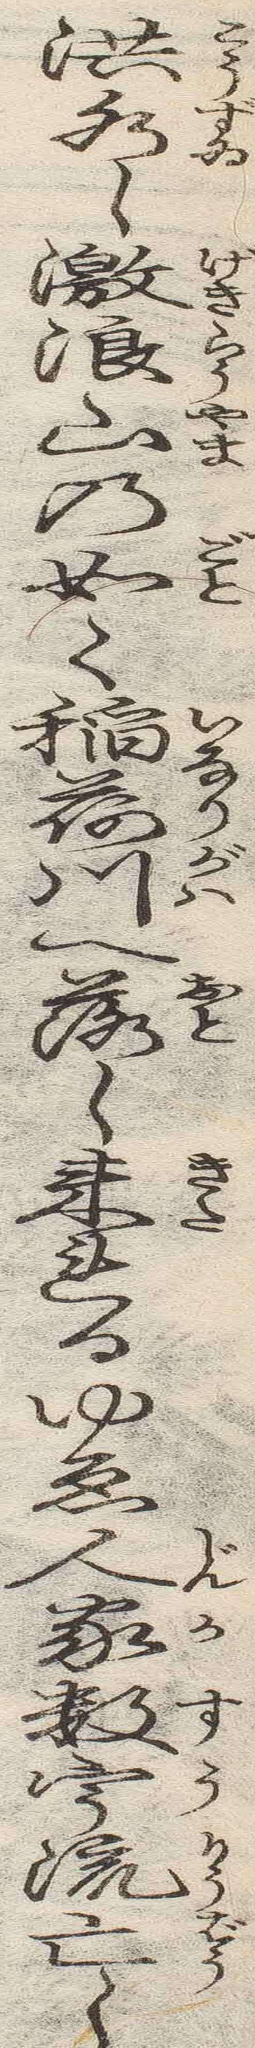洪水し激浪山の如く稲荷川へ落し來れるゆゑ人家数宇流亡し
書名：日光山志
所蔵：東京学芸大学附属図書館 国文学研究資料館
